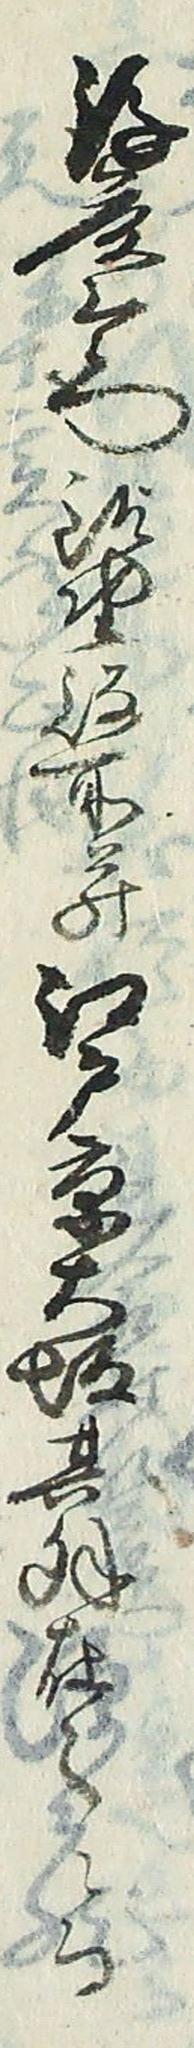後藤三右衛門銀座役所幷江戸京大坂其外在々に而
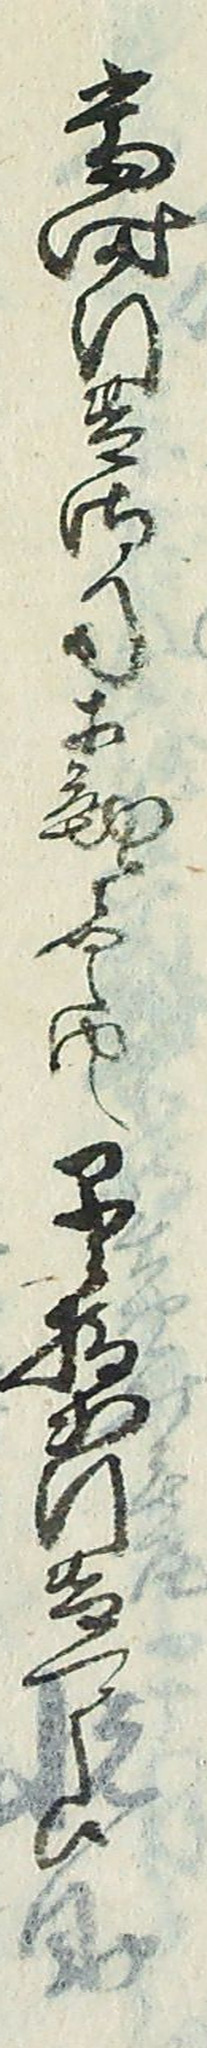当時引替御用相勤候者之内へ早々指出引替可申候
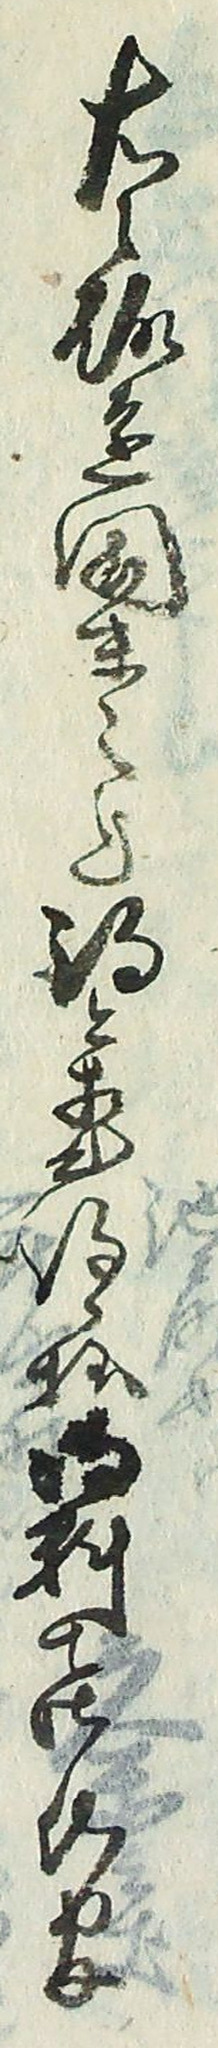右之趣遠国末々迄得と相心得候様御料は御代官
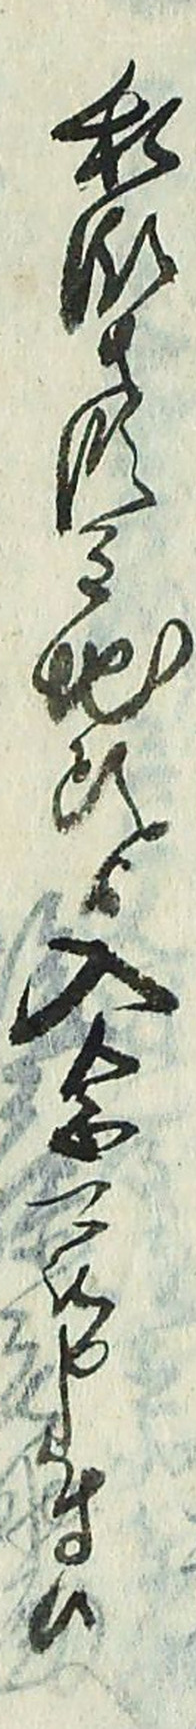私領は領主地頭ゟ入念可被申付候
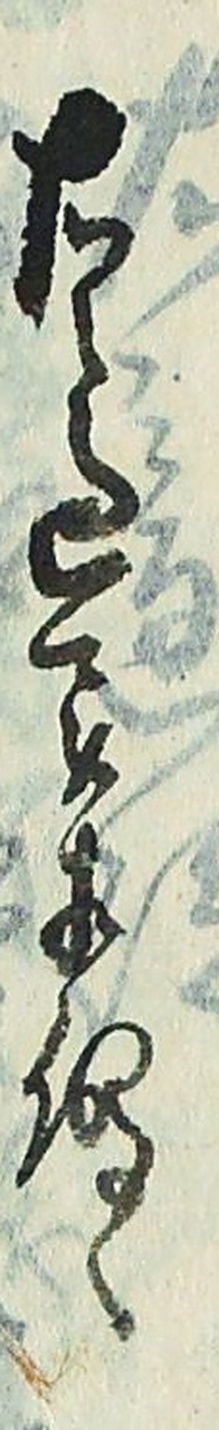右之通可被相触候
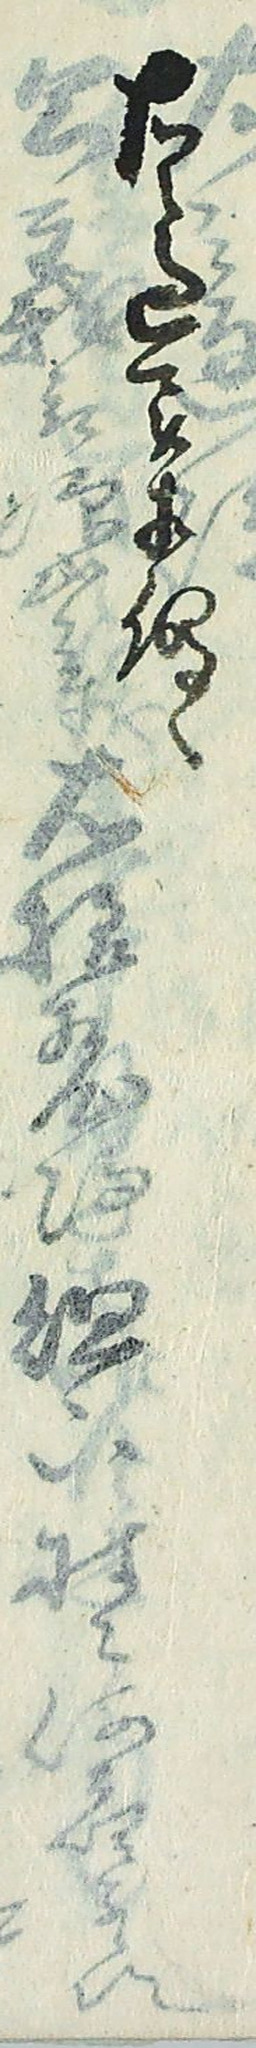右之通可被相触候
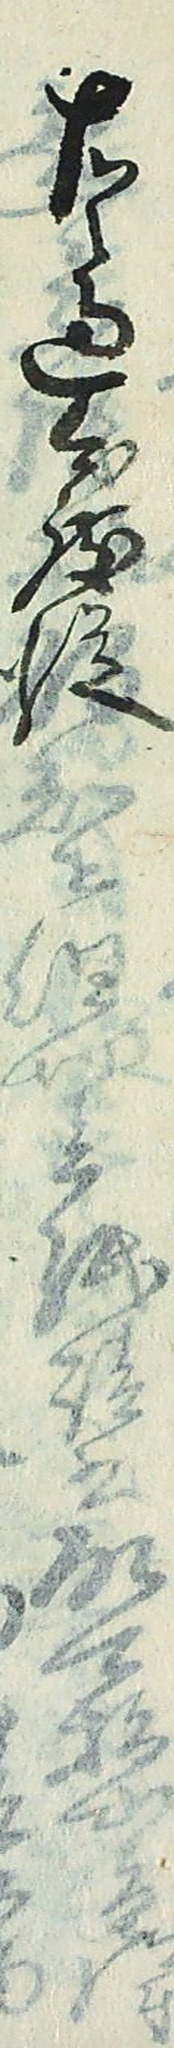右之通今度従
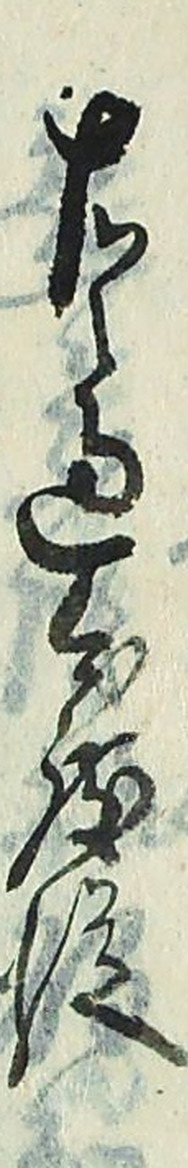右之通今度従
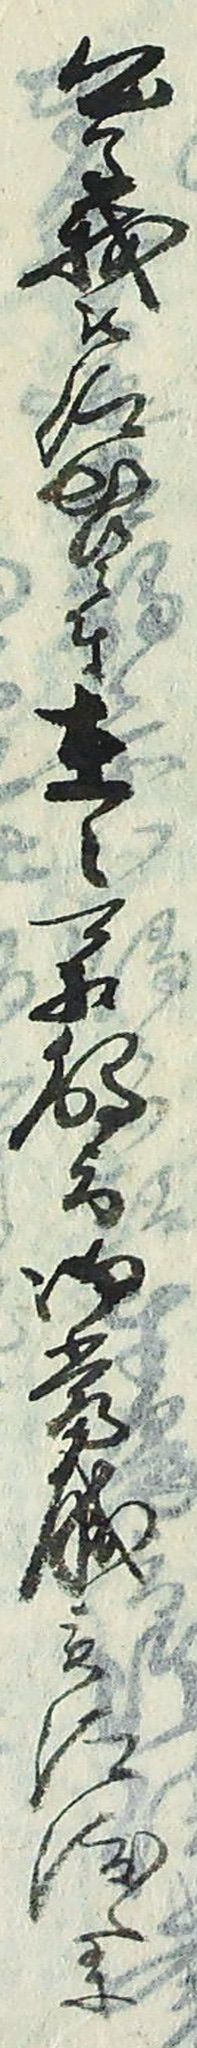公義被仰出候に付在々可相触旨御当職被仰渡候条
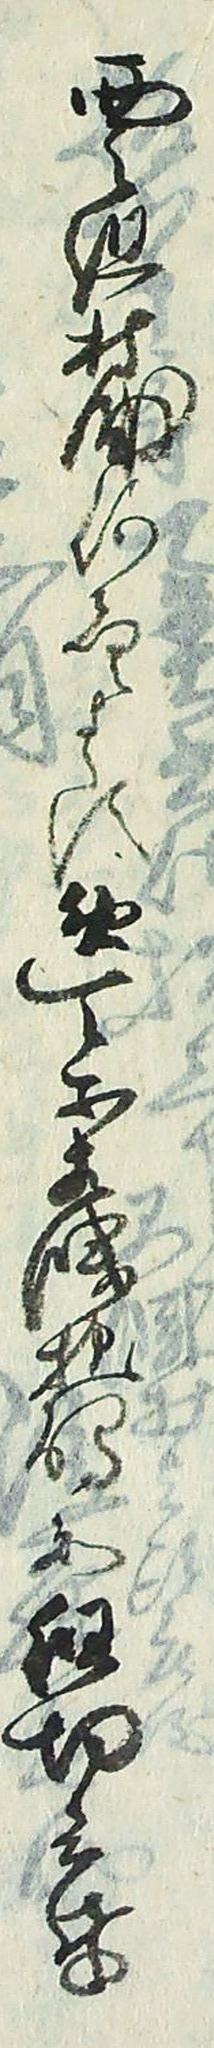西之組村浦何者によらす逸々不相洩様触知組切壱帋
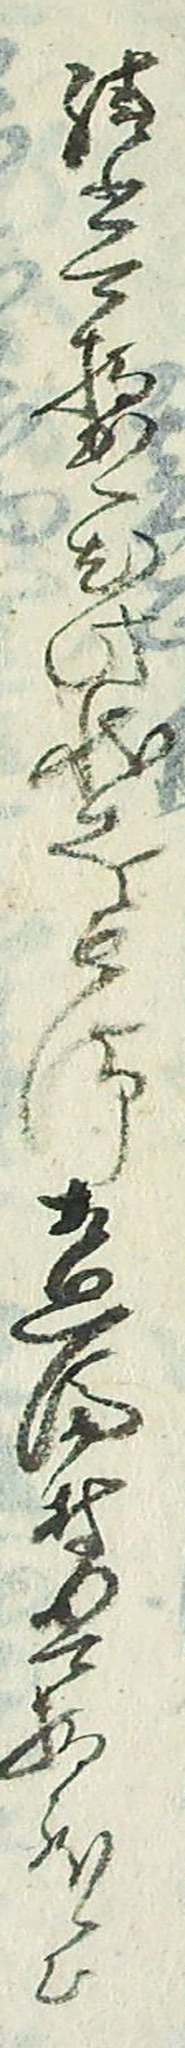請書可指出候尤此状先々無滞相廻済村ゟ可指戻候以上
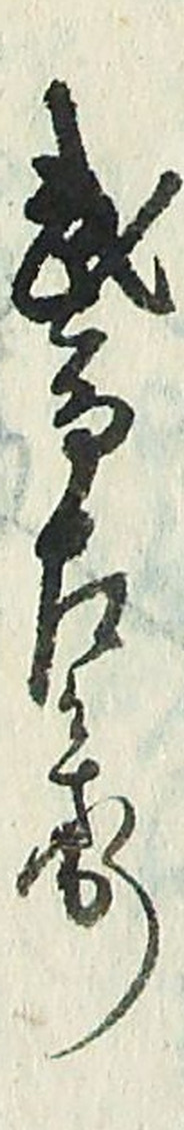武市左兵衛
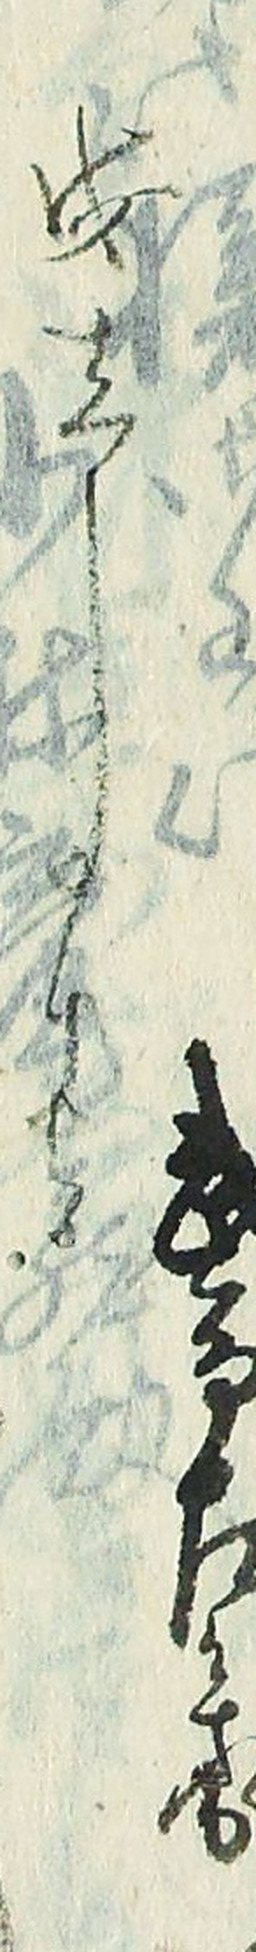戌十一月十五日
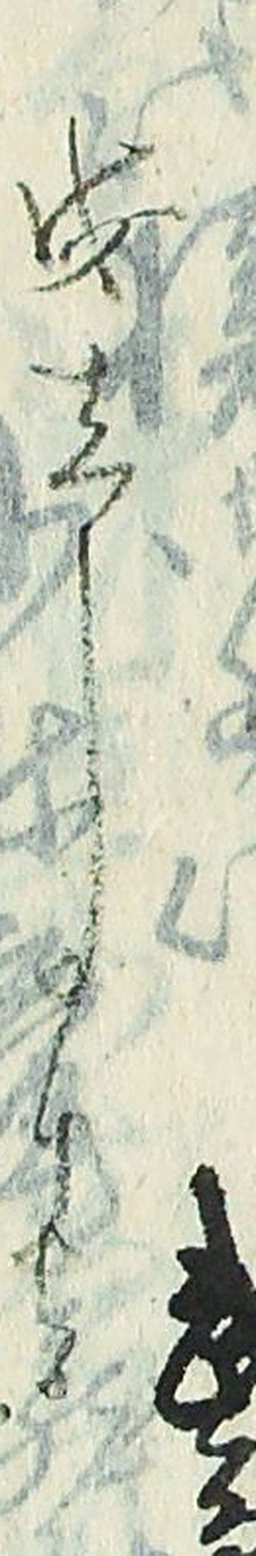戌十一月十五日
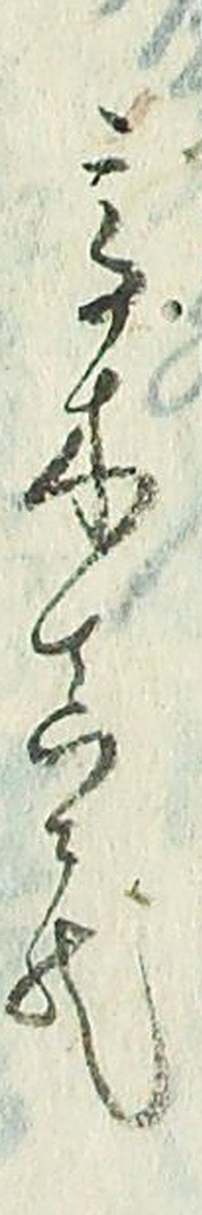高木真蔵
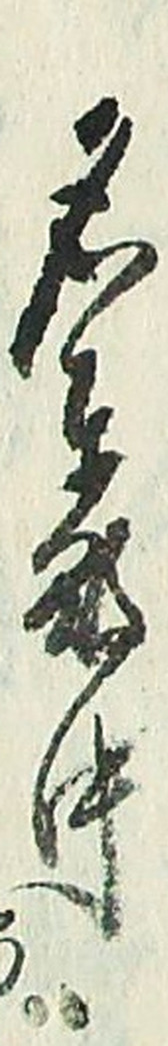名東郡中
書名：諸御用御□受書控
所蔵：鳴門教育大学 Naruto University of Education
